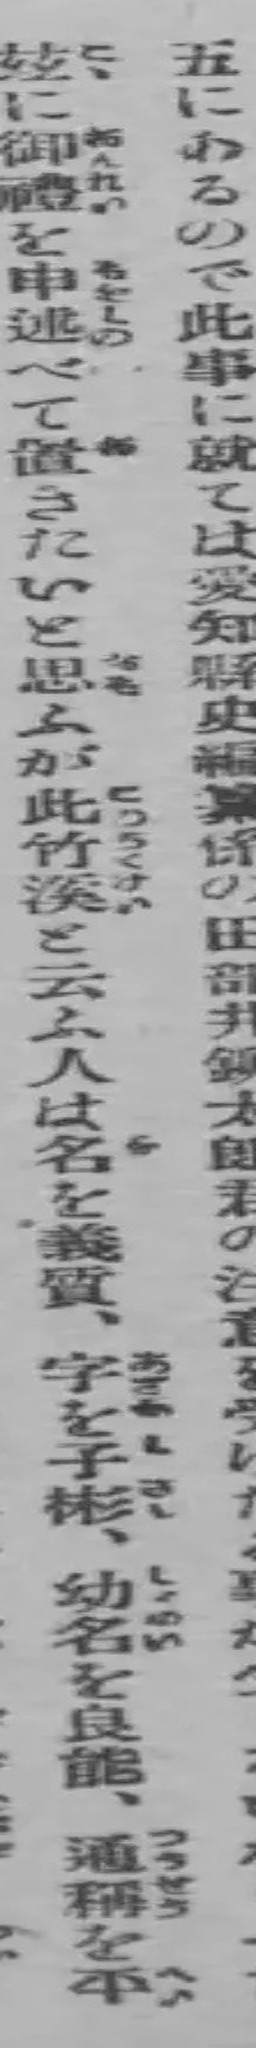茲に御礼を申述べて置きたいと思ふが此竹渓と云ふ人は名を義質、字を子彬、幼名を良能、通称を平
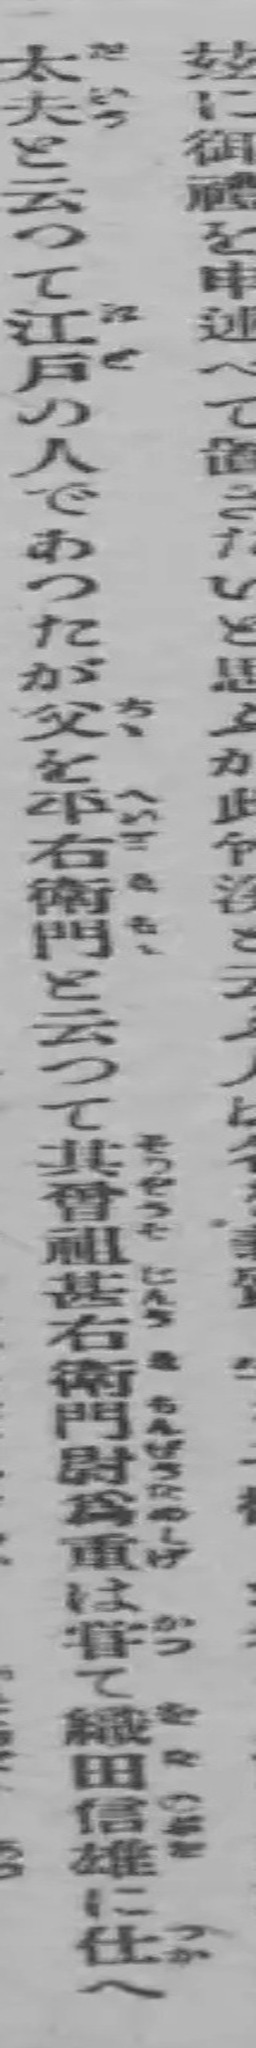太夫と云つて江戸の人であつたが父を平右衛門と云つて其曾祖甚右衛門尉為重は嘗て織田信雄に仕へ
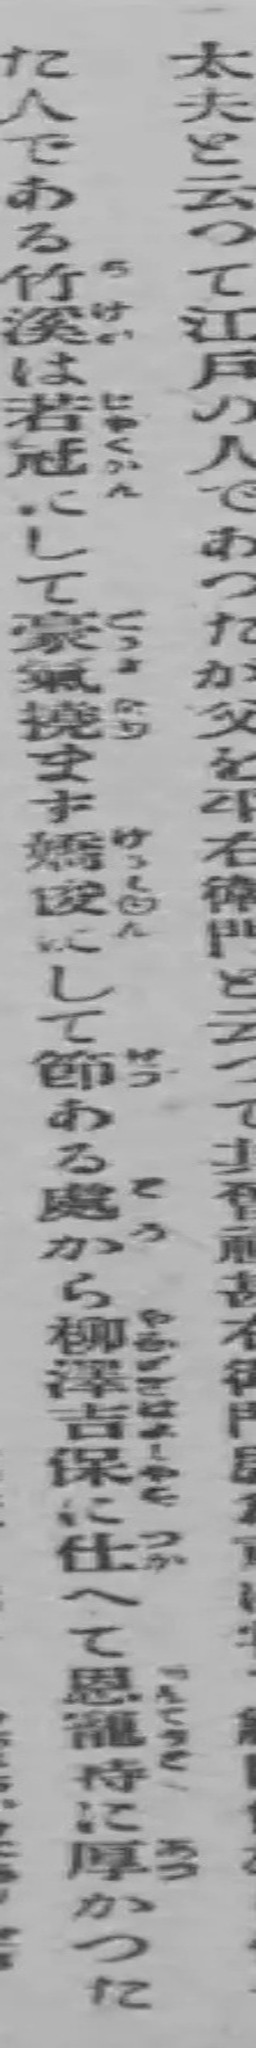た人である竹渓は若冠にして豪気撓まず嬌俊にして節ある処から柳沢吉保に仕へて恩寵特に厚かつた
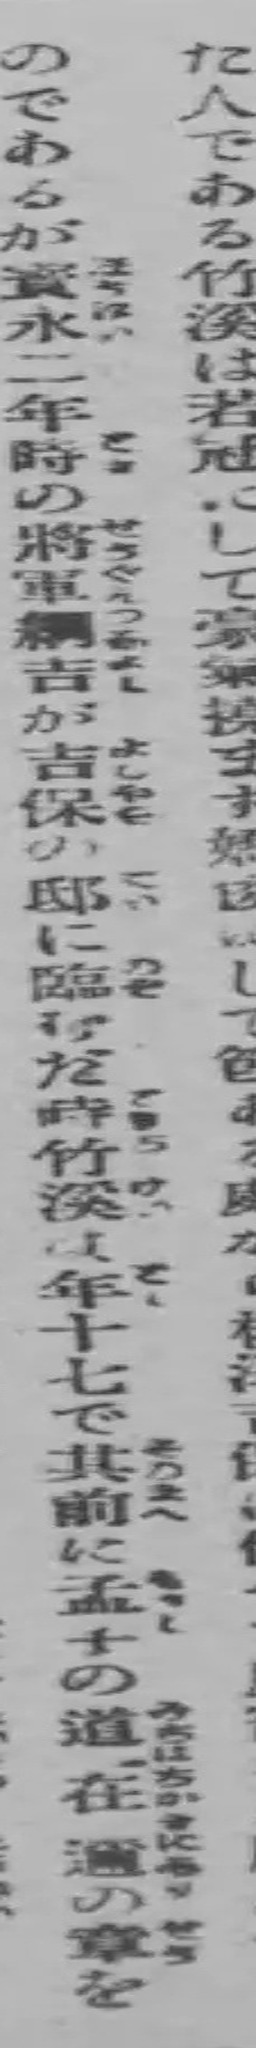のであるが宝永二年時の将軍綱吉が吉保の邸に臨むだ時竹渓は年十七で其前に孟子の道在邇の章を
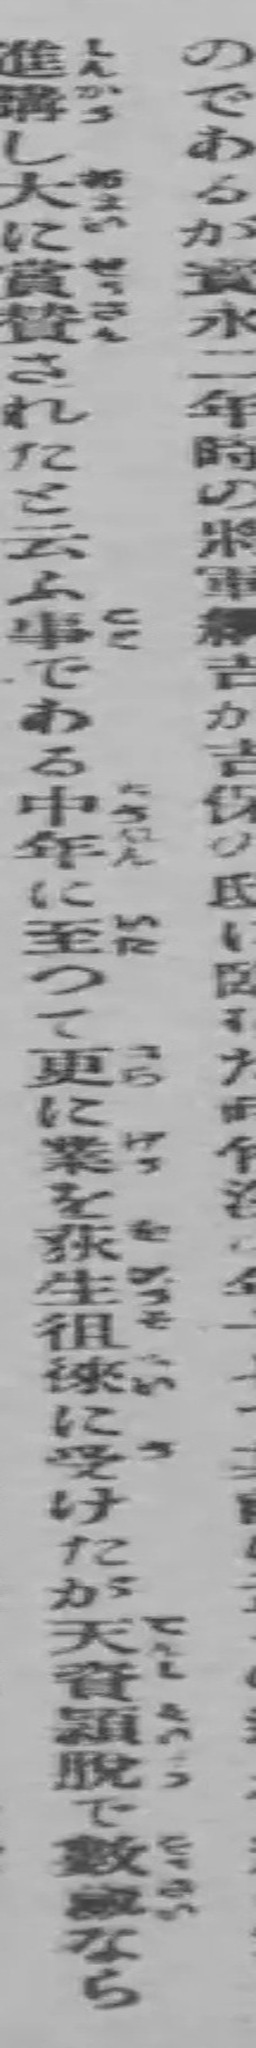進講し大に賞賛されたと云ふ事である中年に至つて更に業を荻生徂徠に受けたが天資穎脱で数歳なら
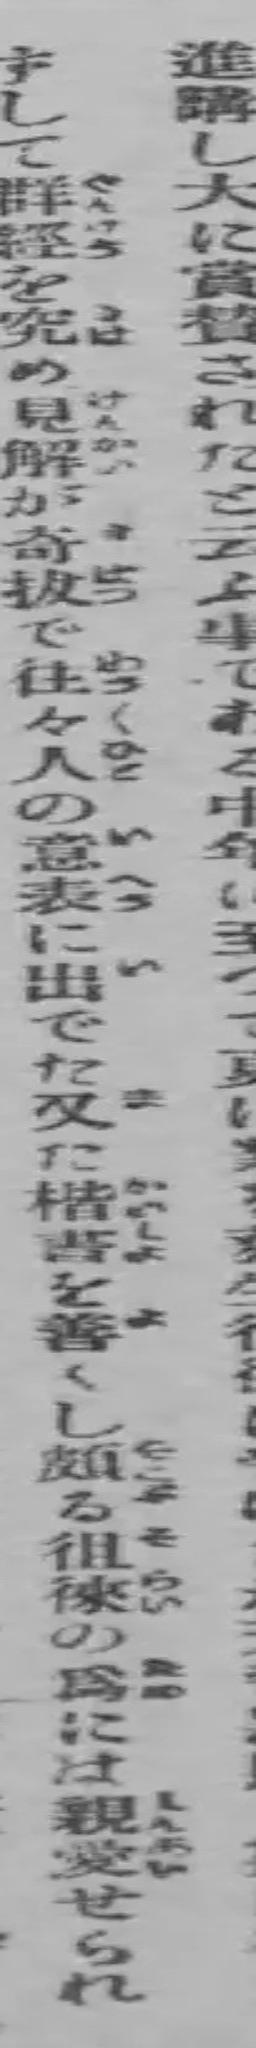ずして群経を究め見解が奇抜で往々人の意表に出でた又た楷書を善くし頗る徂徠の為には親愛せられ
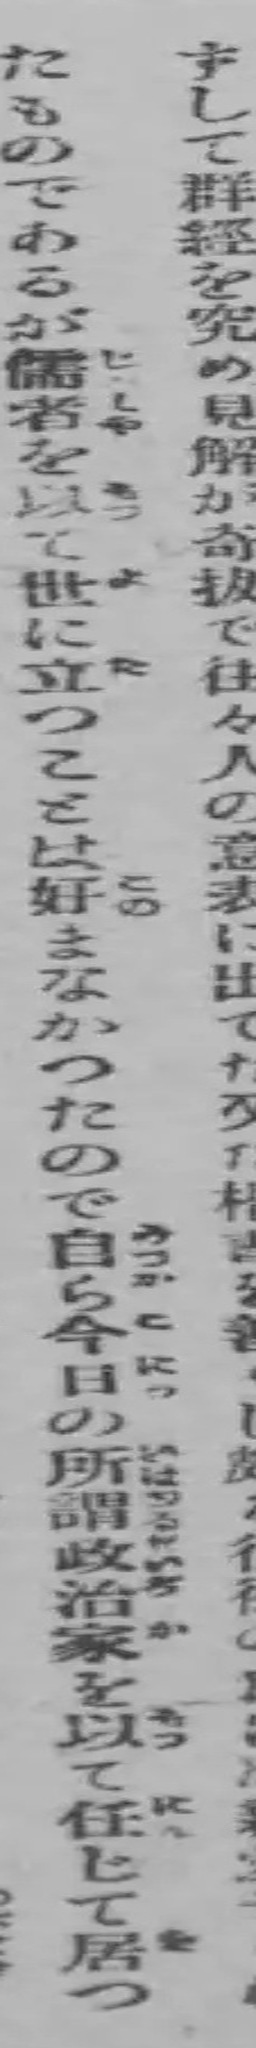たものであるが儒者を以て世に立つことは好まなかつたので自ら今日の所謂政治家を以て任じて居つ
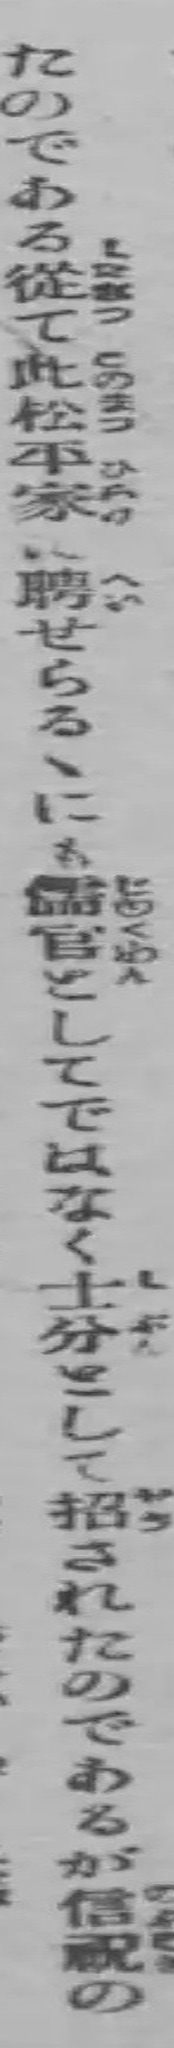たのである従てこ此松平家に聘せらるゝにも儒官としてではなく士分として招されたのであるが信祝の
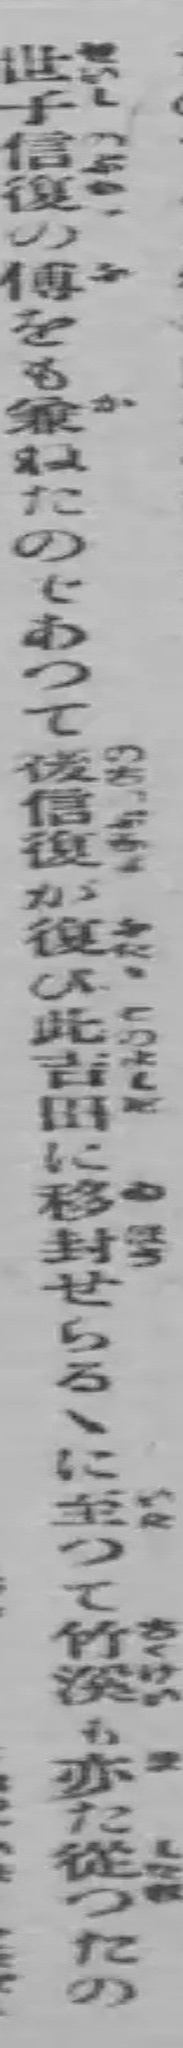世子信復の傅をも兼ねたのであつて後信復が復び此吉田に移封せらるゝに至つて竹渓も亦た従つたの
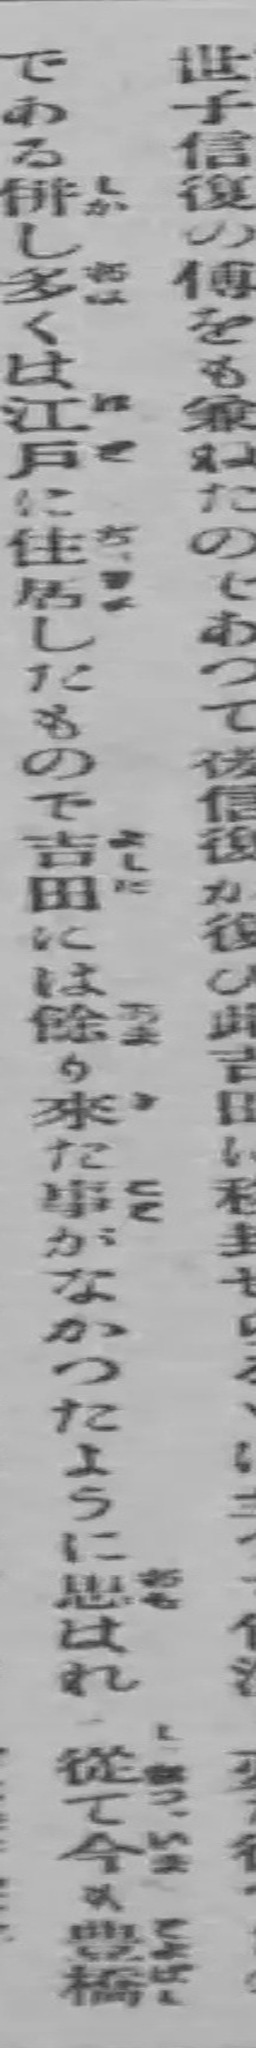である併し多くは江戸に住居したもので吉田には余り来た事がなかつたように思はれる従て今も豊橋
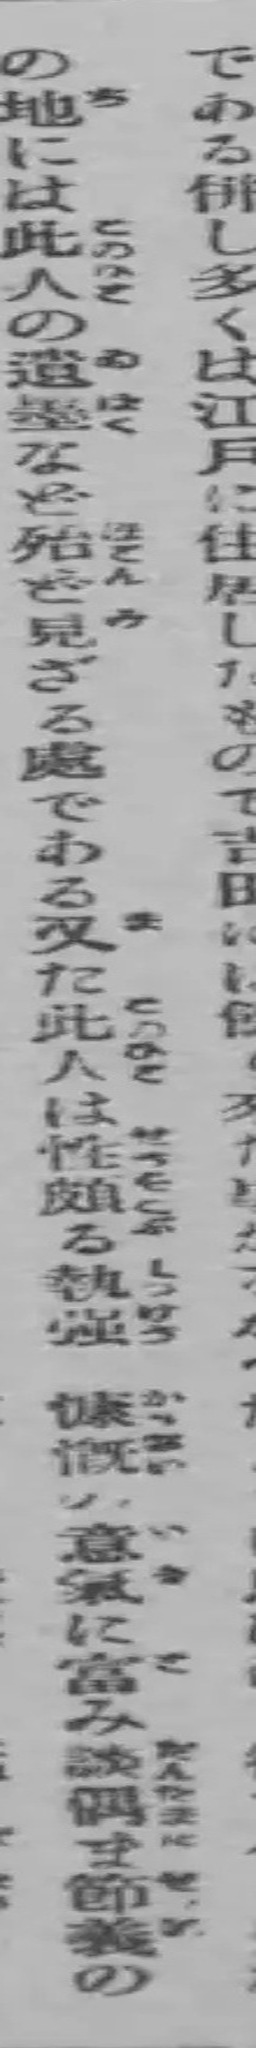の地には此人の遺墨など殆ど見ざる処である又た此人は性頗る執強で慷慨の意気に富み談偶ま節義の
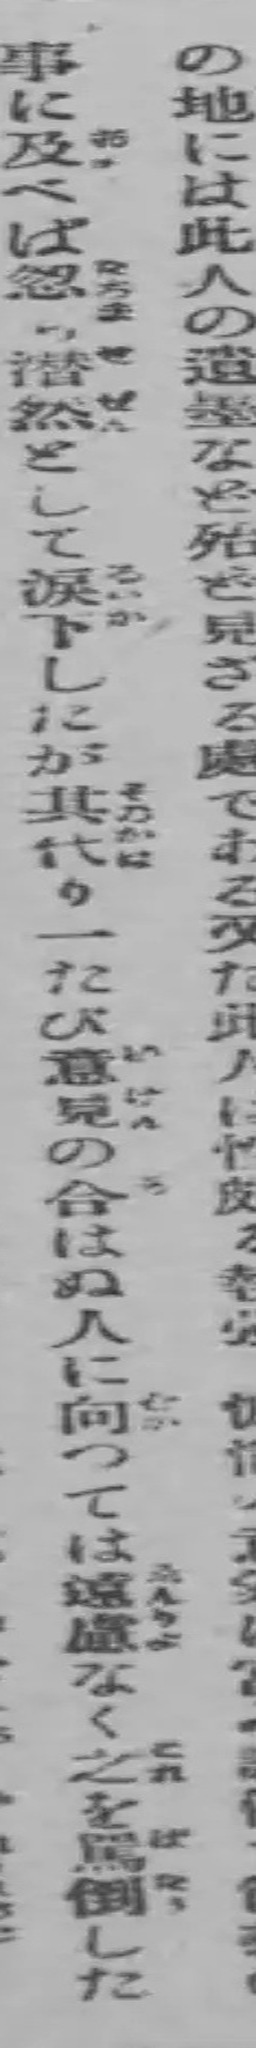事に及べばた忽ち潜然とし涙下したが其代り一たび意見の合はぬ人に向つては遠慮なく之を罵倒した
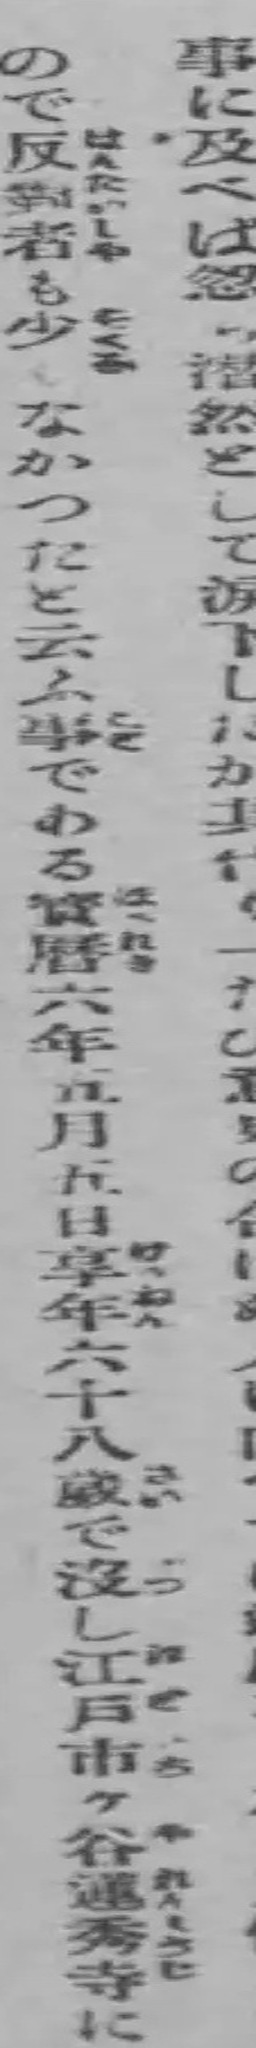ので反対者も少くなかつたと云ふ事である宝暦六年五月五日享年六十八歳で没し江戸市ヶ谷蓮秀寺に
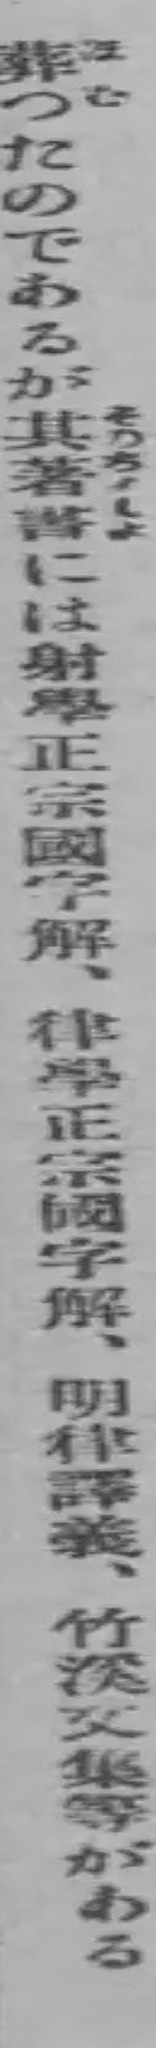葬つたのであるが其著書には射学正宗国字解、律学正宗国字解、明律訳義、竹渓文集等がある

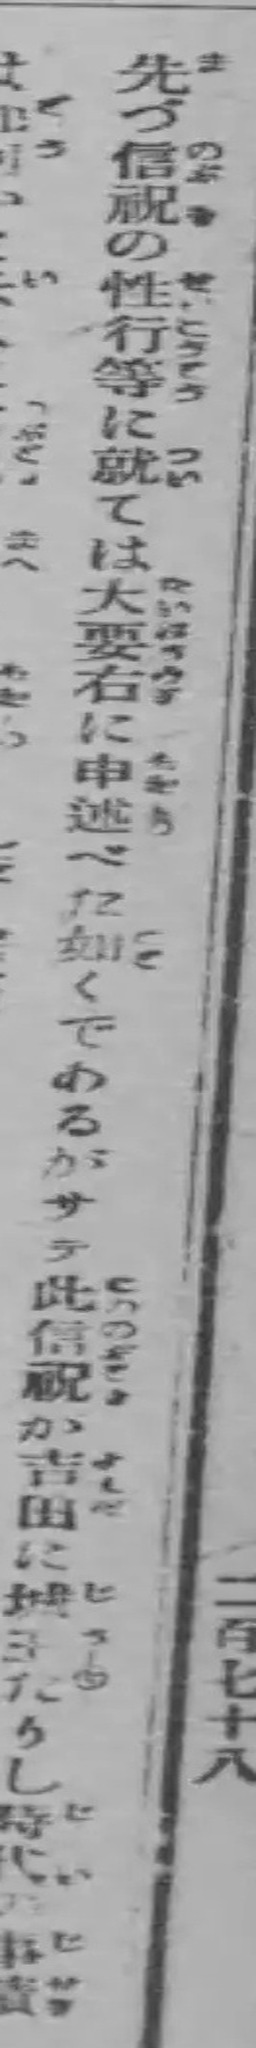先づ信祝の性行等に就ては大要右に申述べた如くであるがサテ此信祝が吉田に城主たりし時代の事蹟
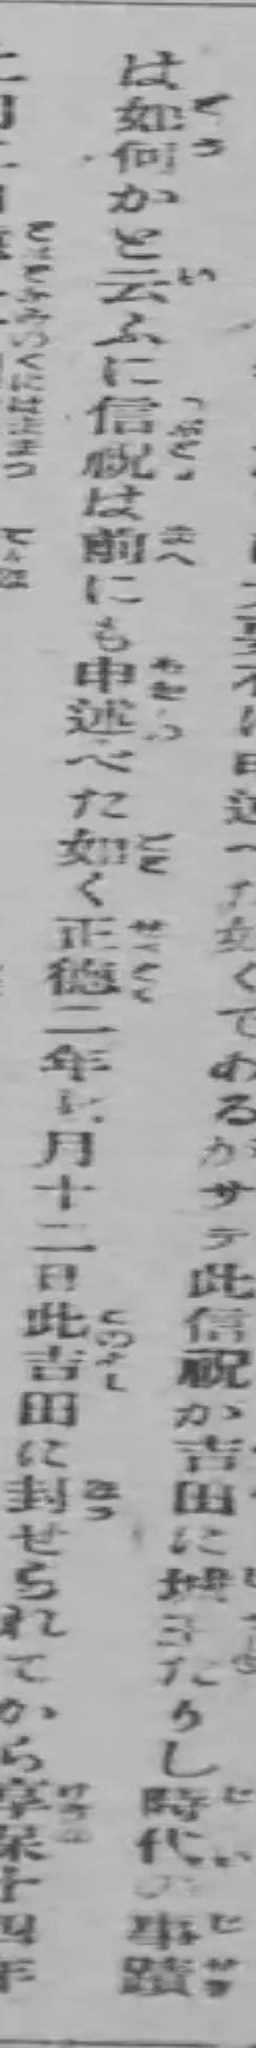は如何かと云ふに信祝は前にも申述べた如く正徳二年七月十二日此吉田に封せられてから享保十四年
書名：豊橋市史談
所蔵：国立国会図書館 National Diet Library, JAPAN
